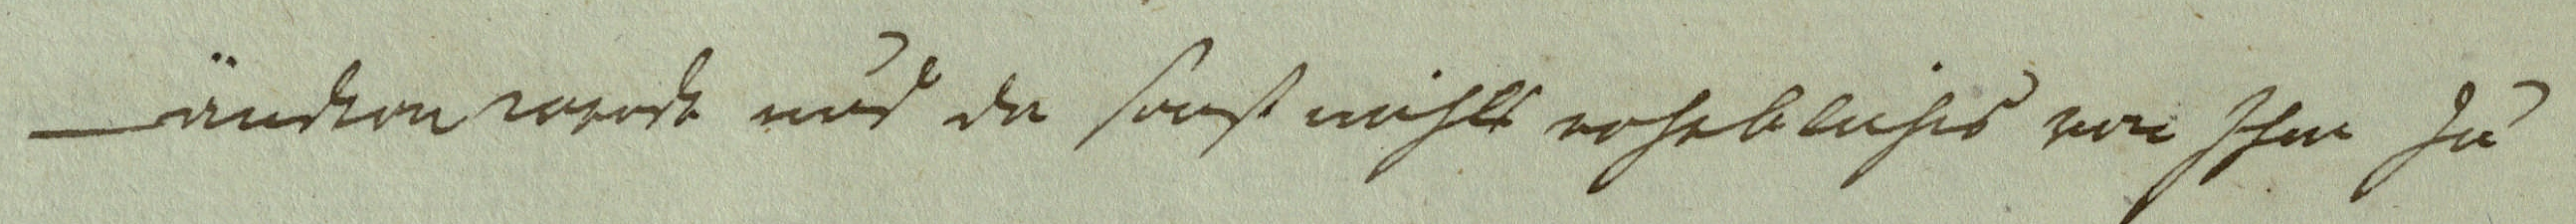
ändern werde und da sonst nichts erhebliches von Ihm zu
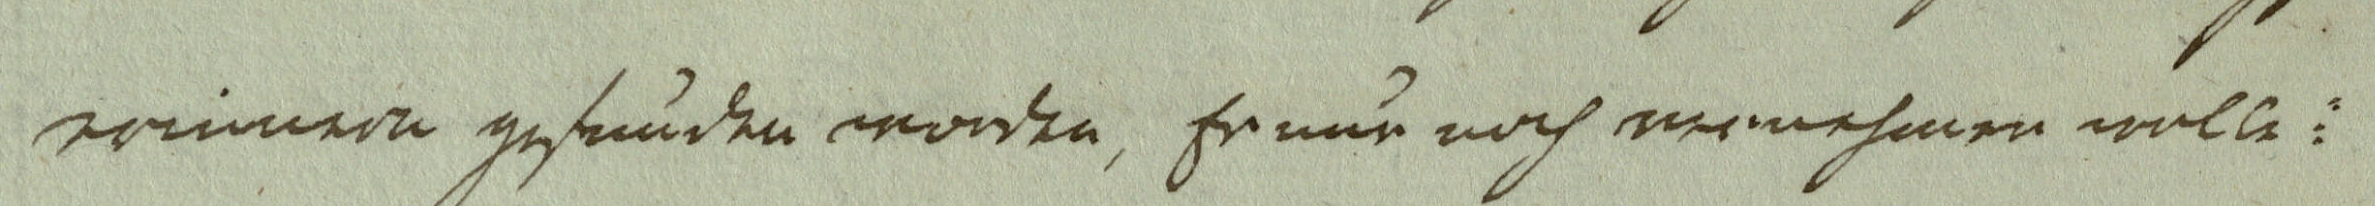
erinnern gefunden worden, Er nur noch vernehmen wolle:
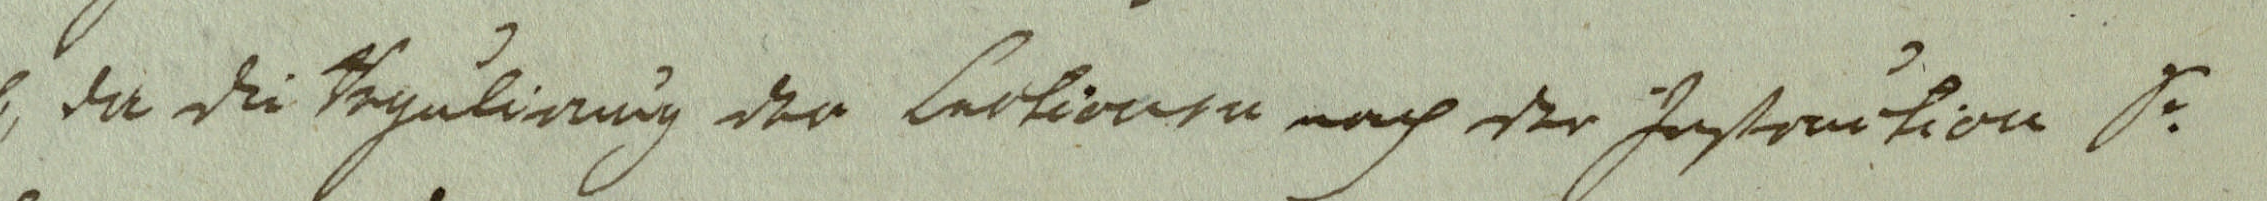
ob, da die Regulirung der Lectionen nach der Instruction Sr.
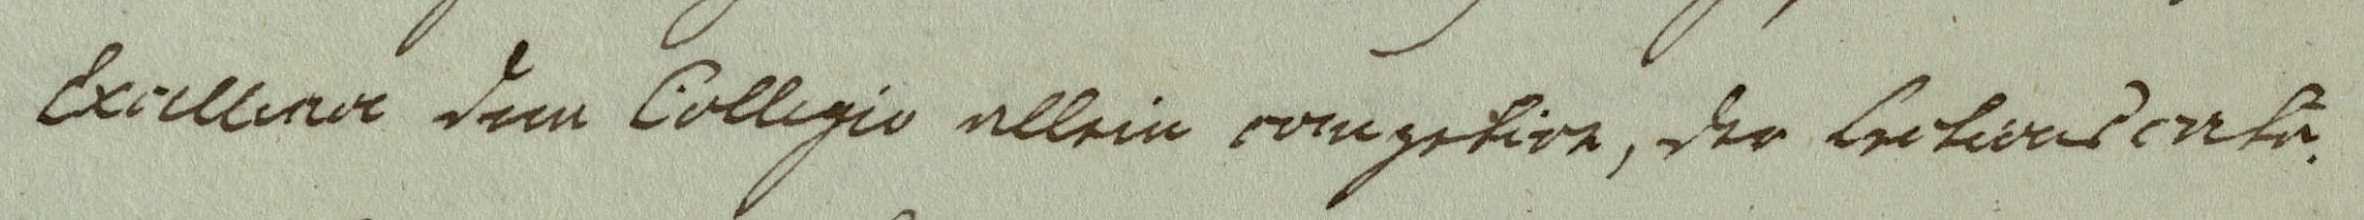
Excellence dem Collegio allein competire, der Lectionscata¬
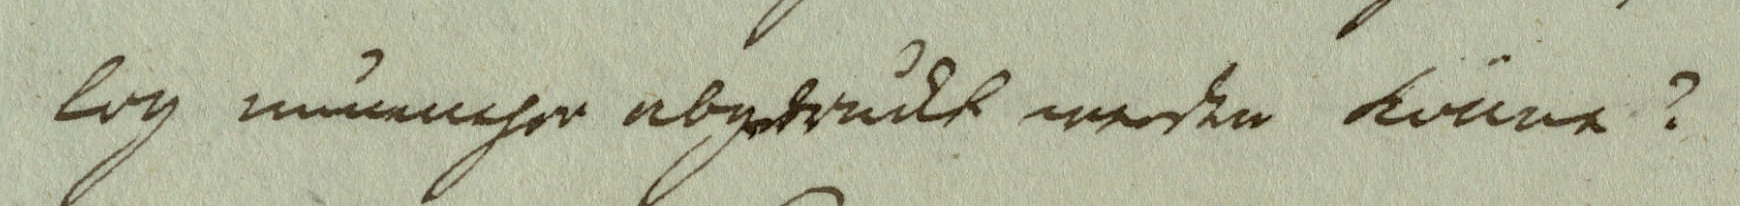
log nunmehro abgedruckt werden könne?
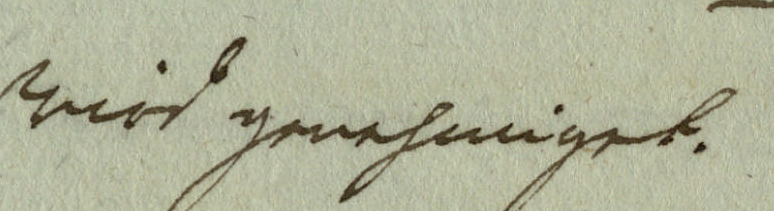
Wird genehmiget.
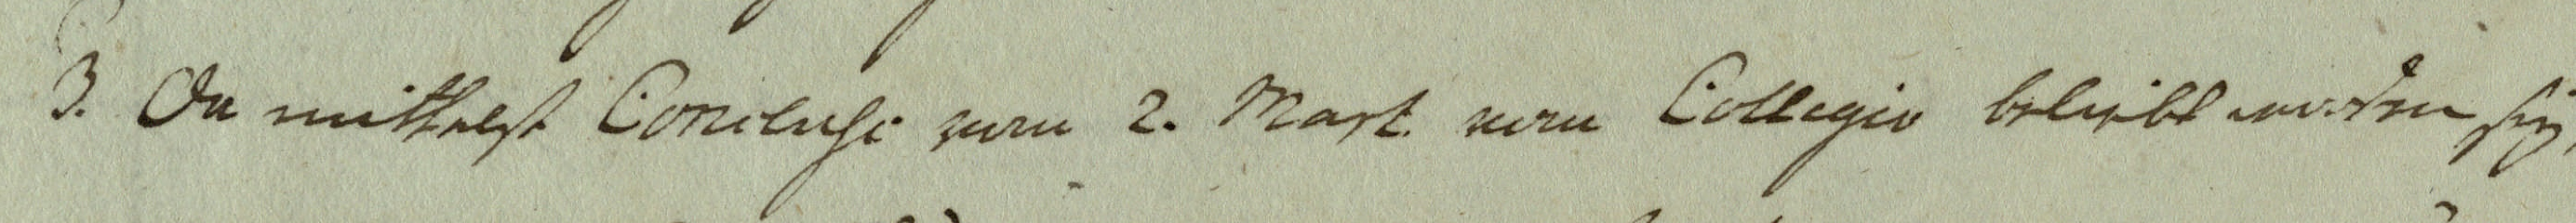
3. Da mittelst Concluso vom 2. Mart vom Collegio beliebt worden seÿ,
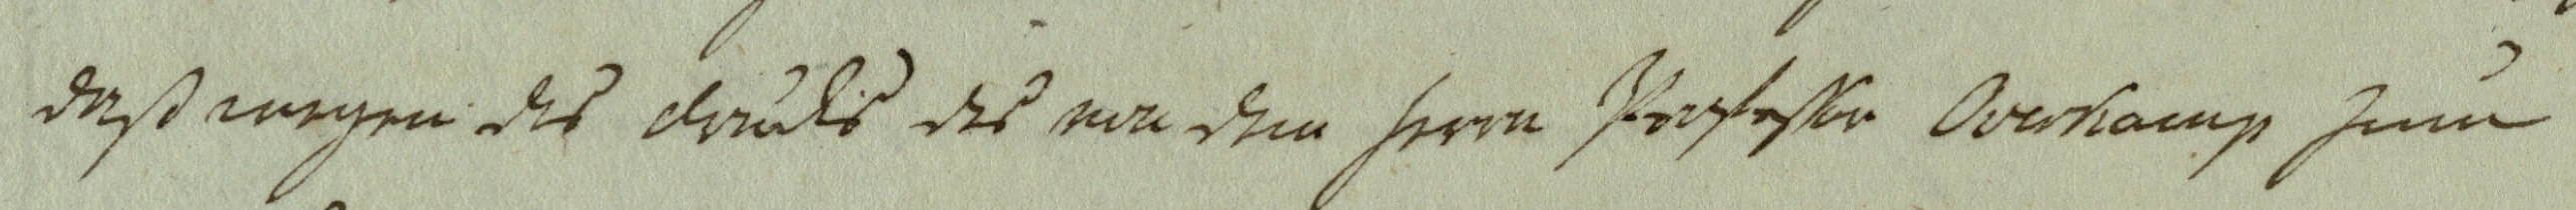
daß wegen des Drucks des von dem Herrn Professor Overkamp zum
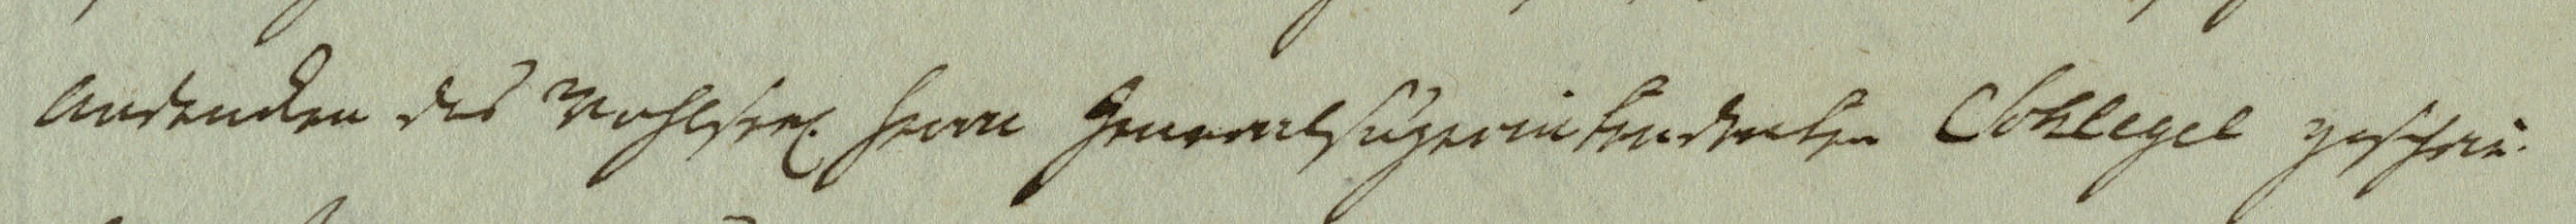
Andencken des Wohlseel. Herrn Generalsuperintendenten Schlegel geschrie¬
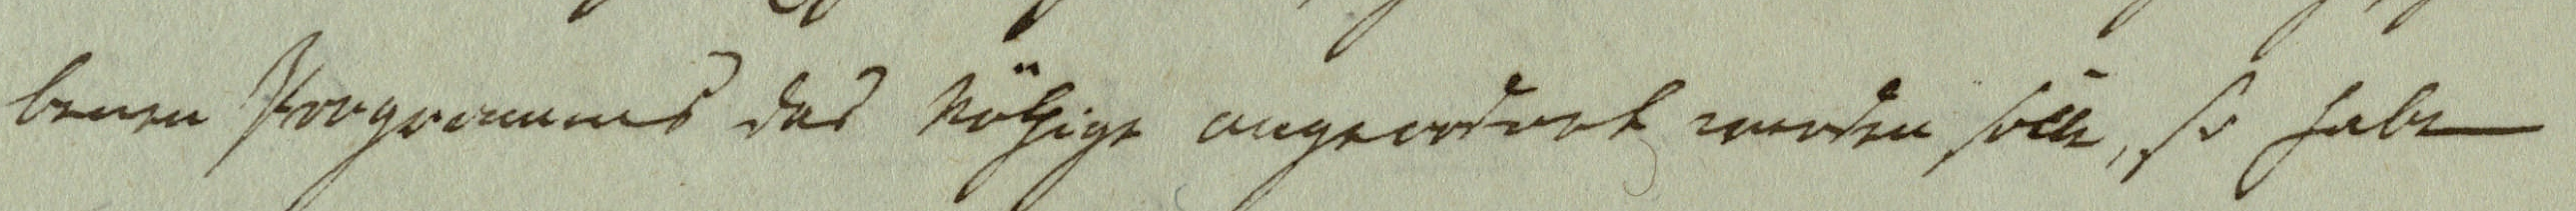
benen Programms das Nöthige angeordnet werden solle, so habe
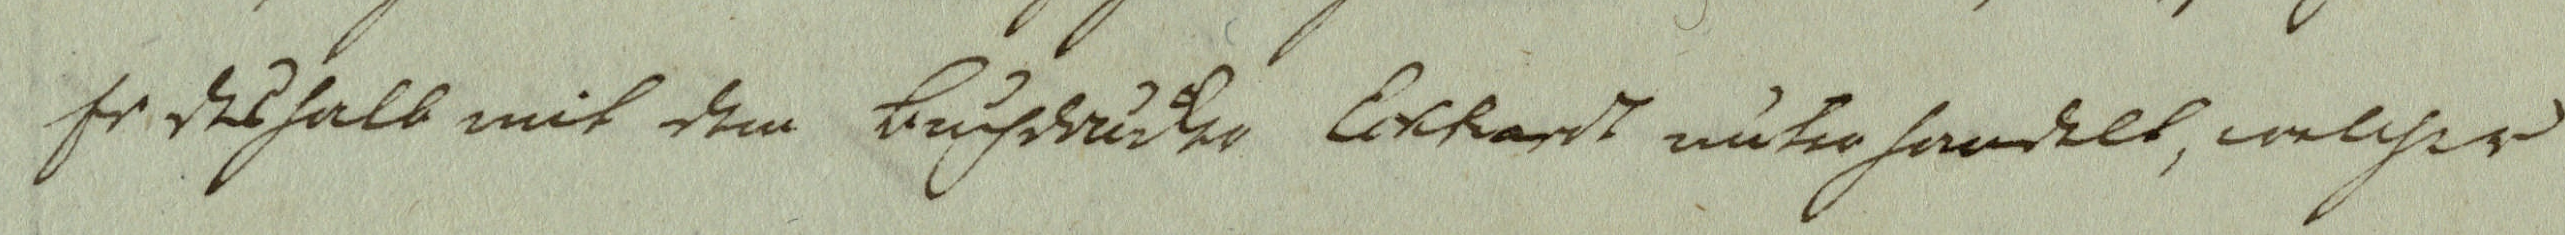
Er deshalb mit dem Buchdrucker Eckhardt unterhandelt, welcher
